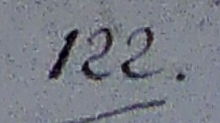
122.
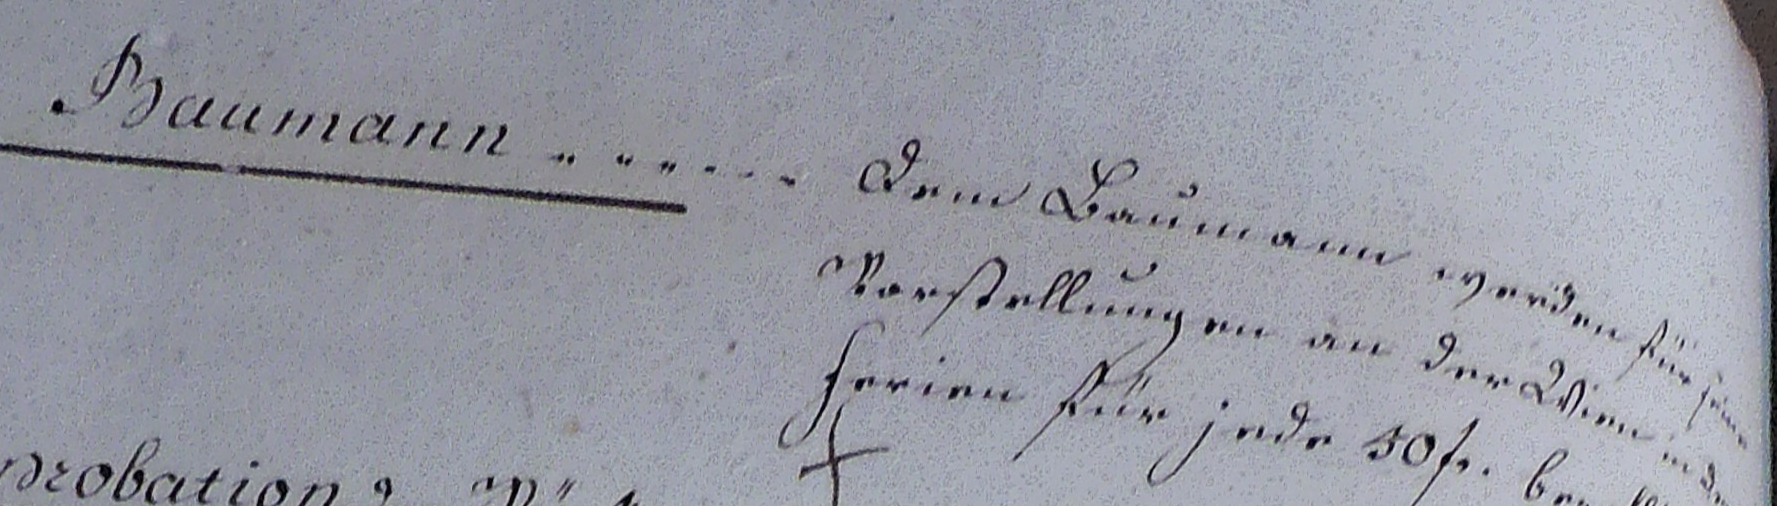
Baumann .. .. .. .. . .. Dem Baumann werden für seine
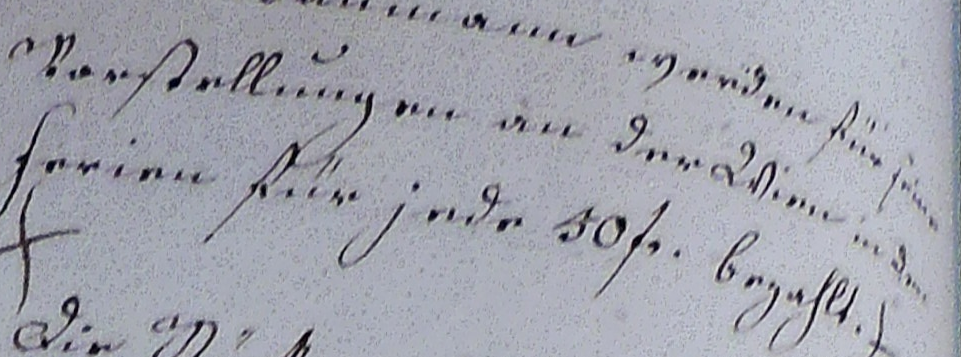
Vorstellungen an der Wien in den
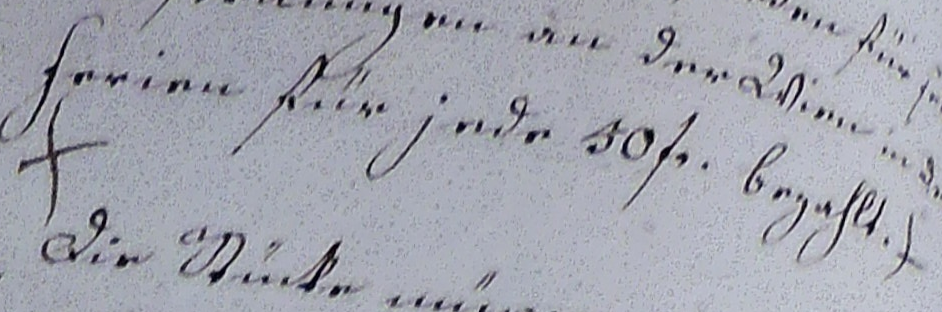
Ferien für jede 50fr. bezahlt f
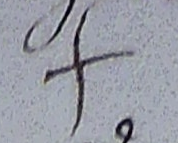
f
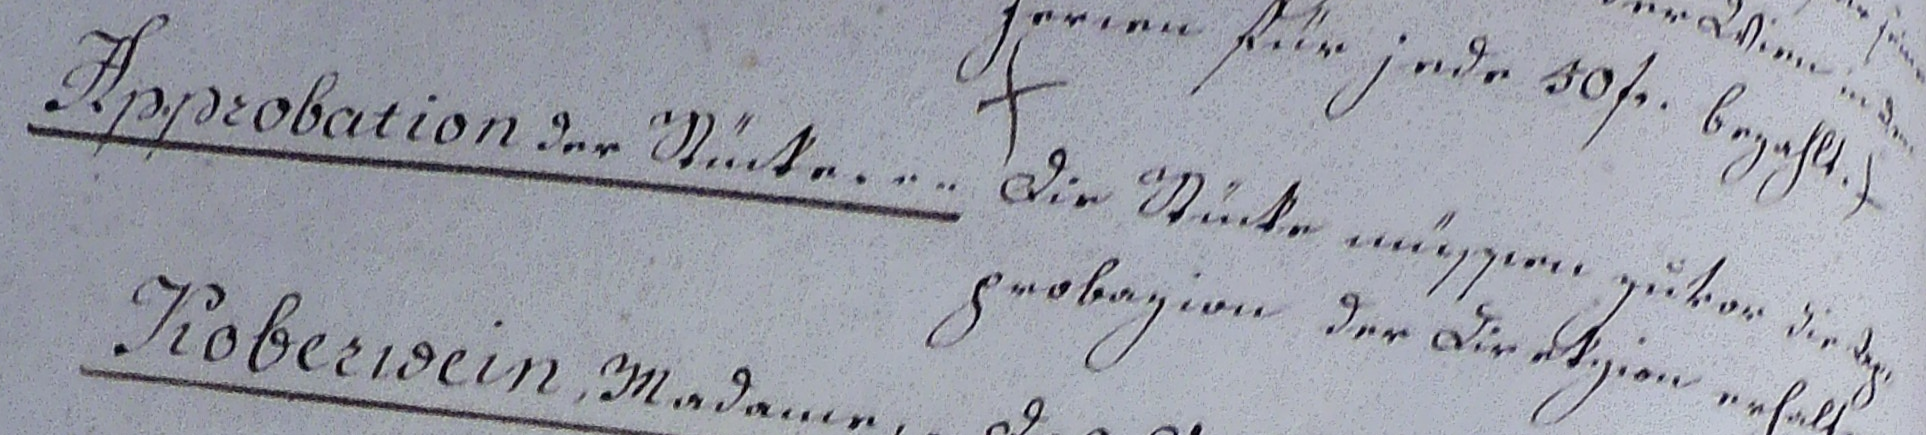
Approbation der Stücke. .. .. Die Stücke müssen zuvor die Ap¬
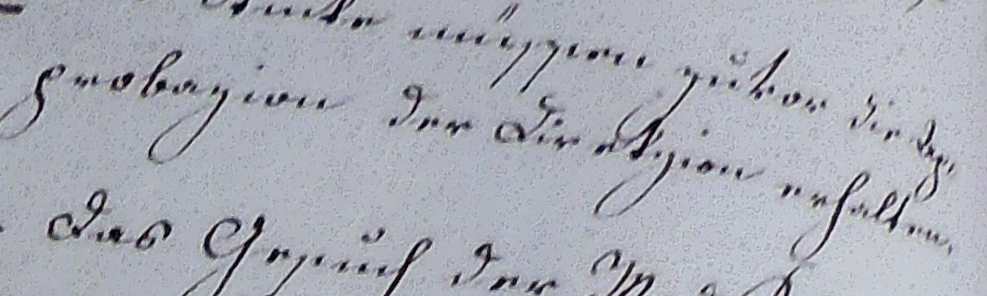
probazion der Direkzion erhalten.
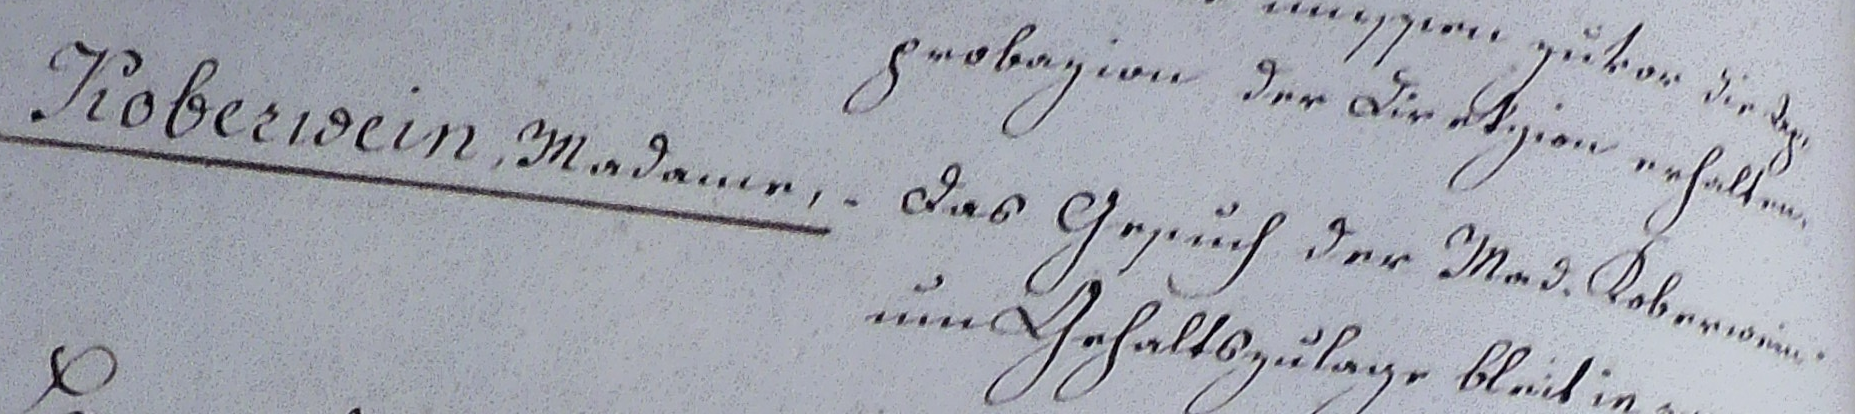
Koberwein, Madame, .. Das Gesuch der Mad. Koberwein
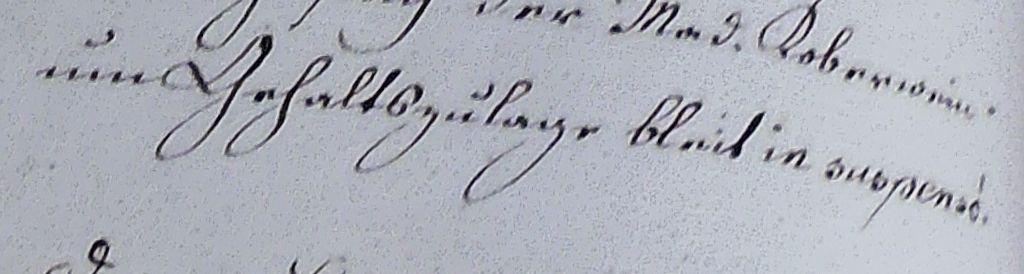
um Gehaltszulage bleit in suspenso.
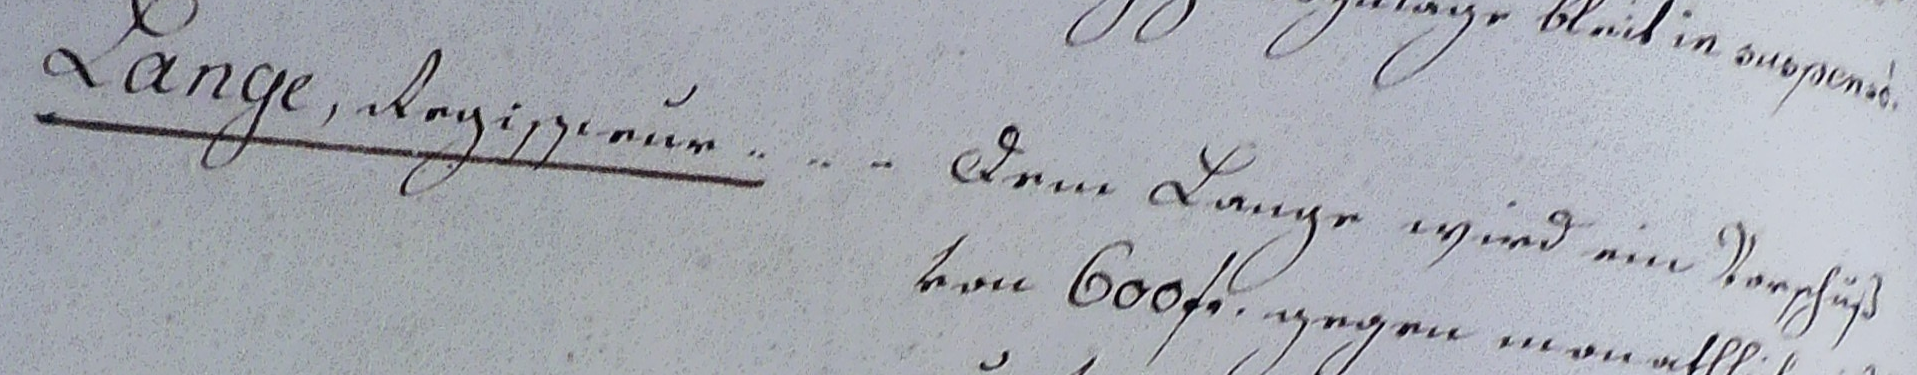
Lange, Regisseur .. .. .. Dem Lange wird ein Vorschuß
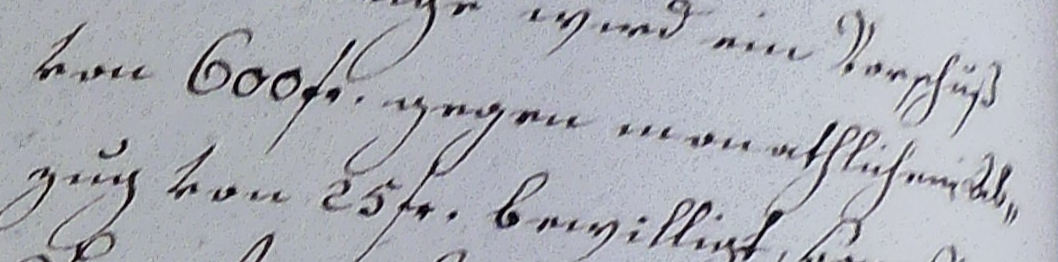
von 600fr. gegen monathlichen Ab¬
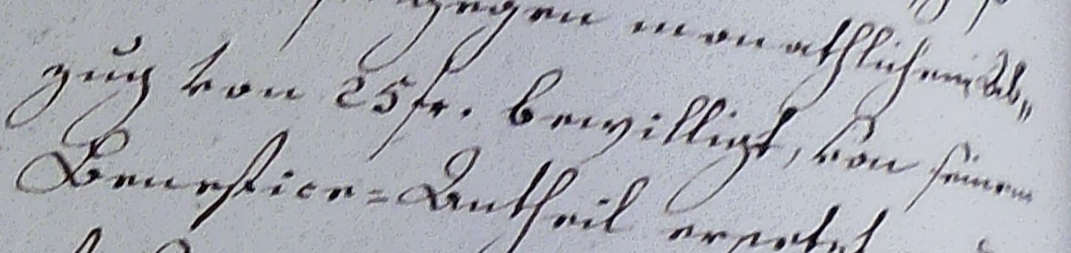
zug von 25fr. bewilligt, von seinem
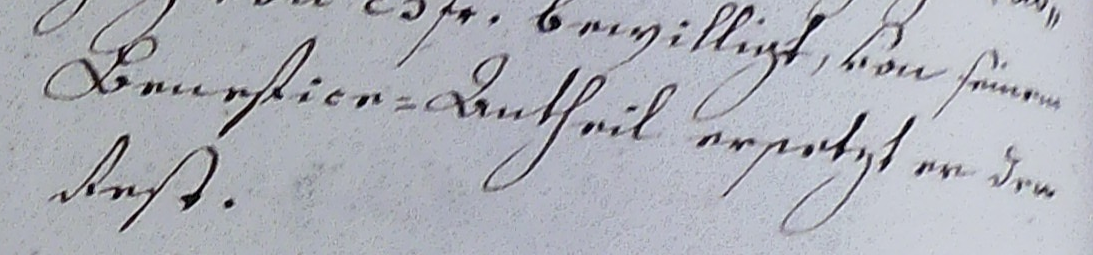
Benefice=Antheil ersetzt er den
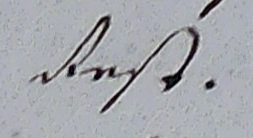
Rest.
